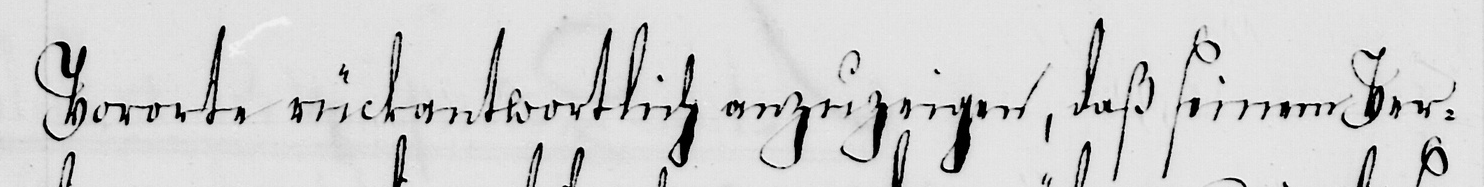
Vororte rückantwortlich anzuzeigen, daß seinem Ver¬
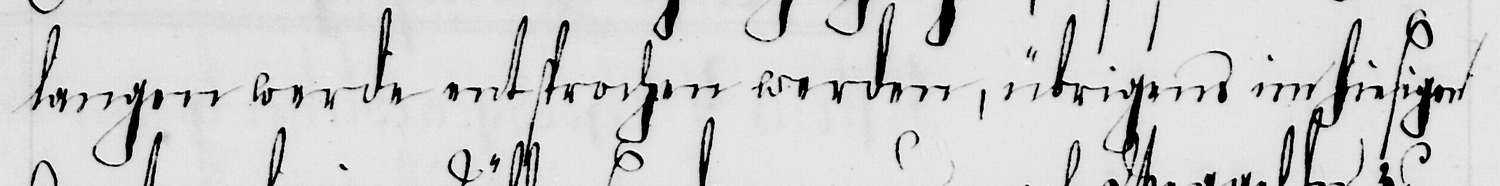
langen werde entsprochen werden, übrigens im hiesigen
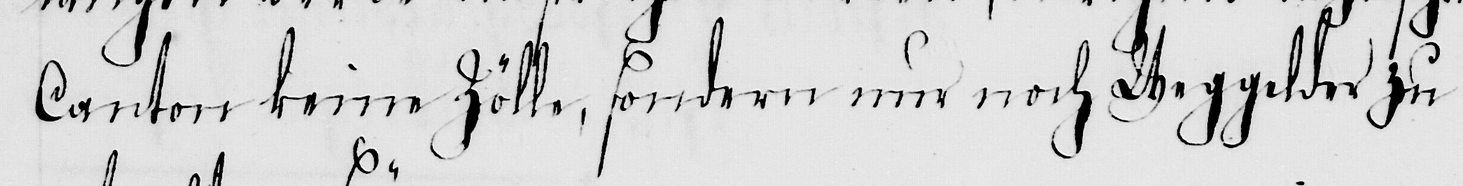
Canton keine Zölle, sondern nur noch Weggelder zu
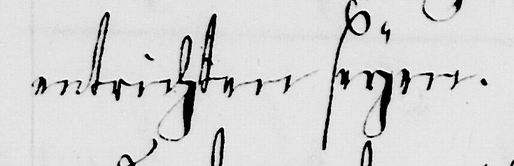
entrichten seyen.
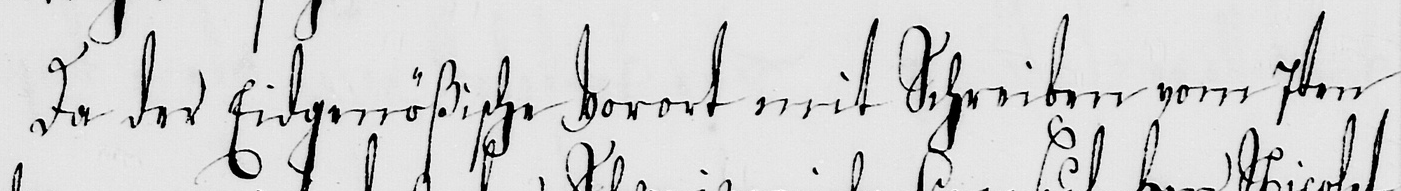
Da der Eidgenößische Vorort mit Schreiben vom 7ten
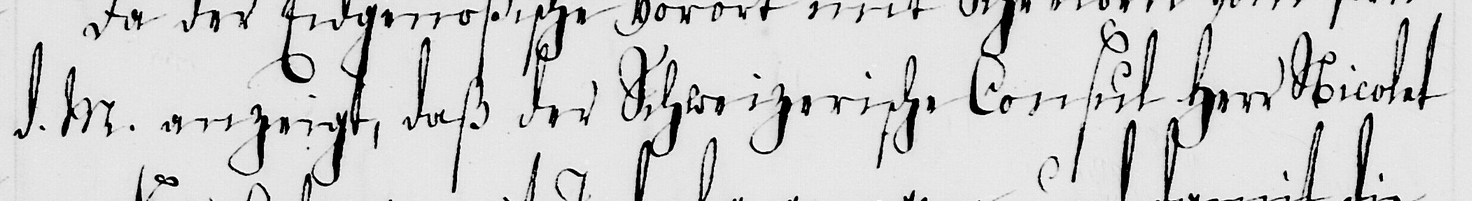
d. M. anzeigt, daß der Schweizerische Consul Herr Nicolat
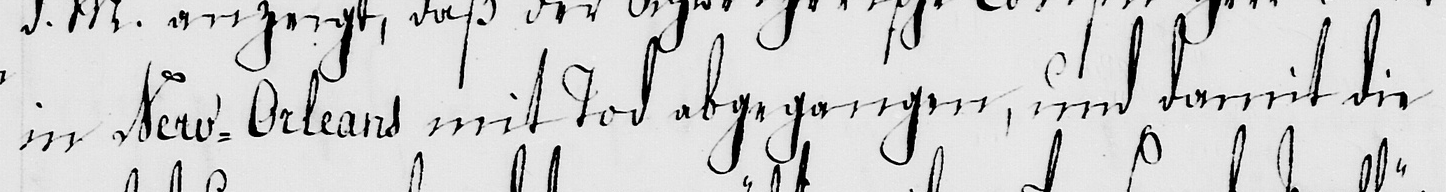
in New-Orleans mit Tod abgegangen, und damit die
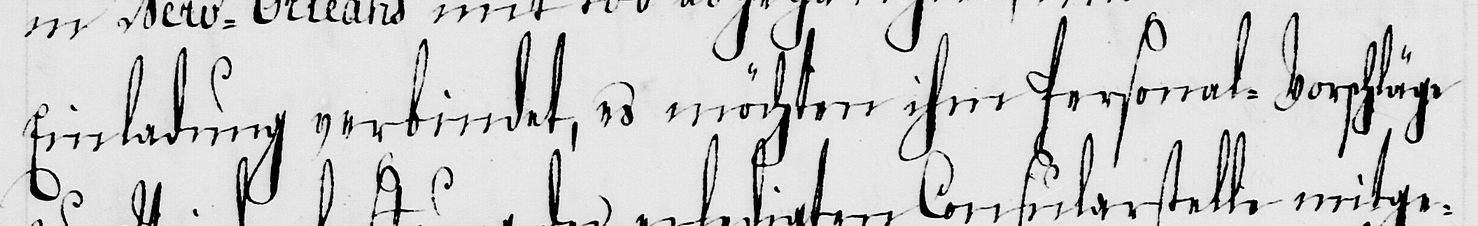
Einladung verbindet, es möchten ihm Personal-Vorschl¬
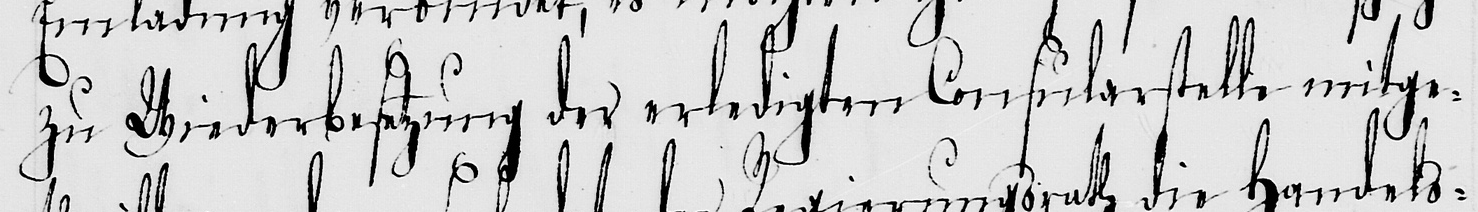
zu Wiederbesetzung der erledigten Consularstelle mitge¬
